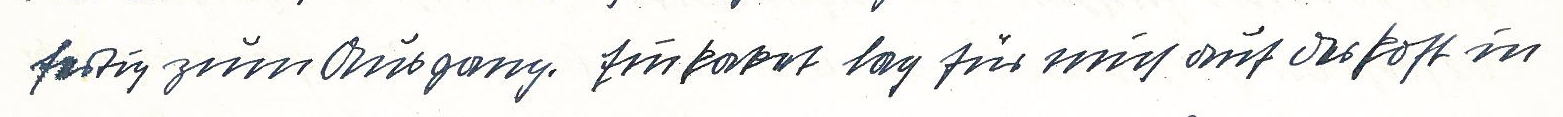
fertig zum Ausgang. Ein Paket lag für mich auf der Post in
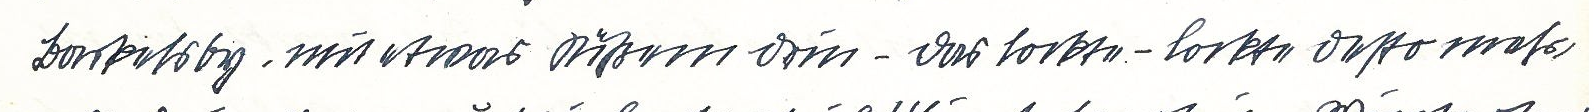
Barkelsby, mit etwas Süßem drin – das lockte – lockte desto mehr,
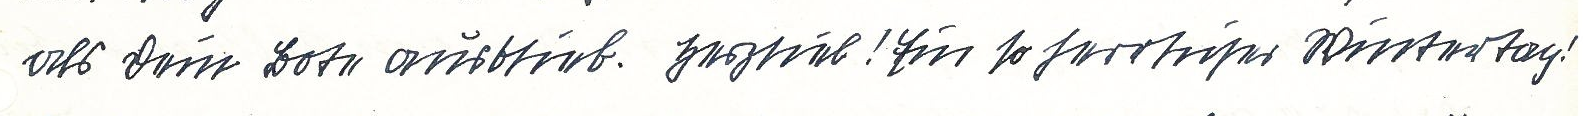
als Dein Bote ausblieb. Herzlieb! Ein so herrlicher Wintertag!
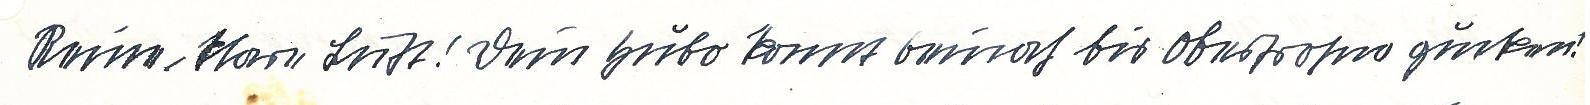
Reine, klare Luft! Dein Hubo konnt beinah bis O. gucken!
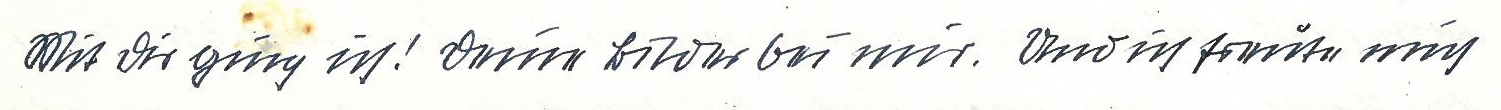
Mit Dir ging ich! Deine Bilder bei mir. Und ich freute mich
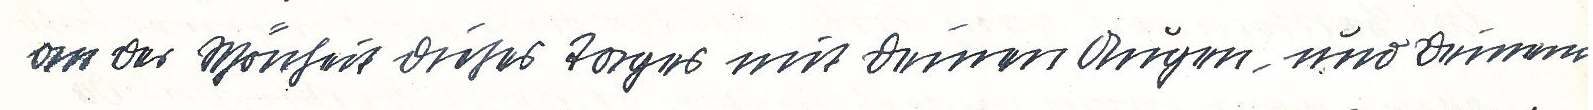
an der Schönheit dieses Tages mit Deinen Augen, und Deinem
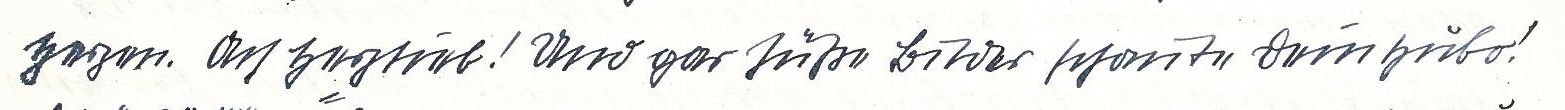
Herzen. Ach Herzlieb! Und gar süße Bilder schaute Dein Hubo!
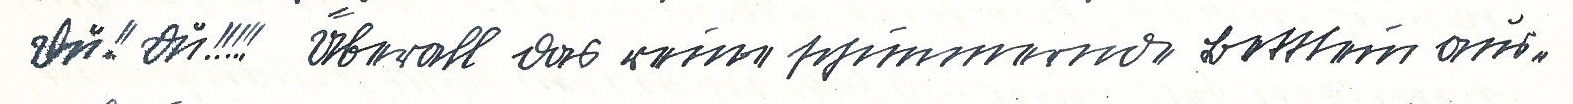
Du!! Du!!!!! Überall das reine schimmernde Bettlein aus¬
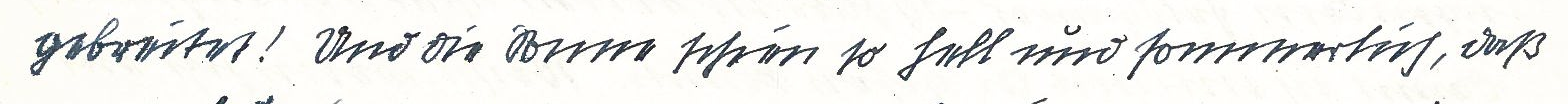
gebreitet! Und die Sonne schien so hell und sommerlich, daß
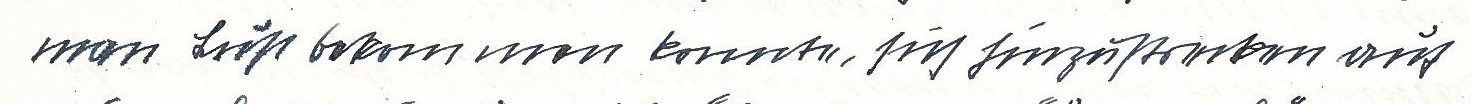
man Lust bekommen konnte, sich hinzustrecken auf
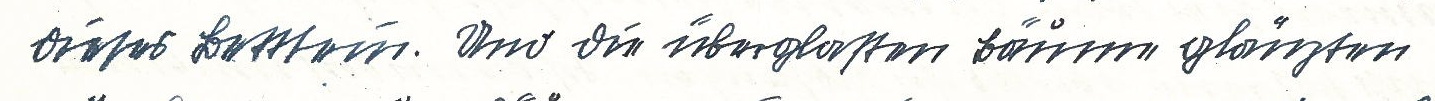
dieses Bettlein. Und die überglasten Bäume glänzten
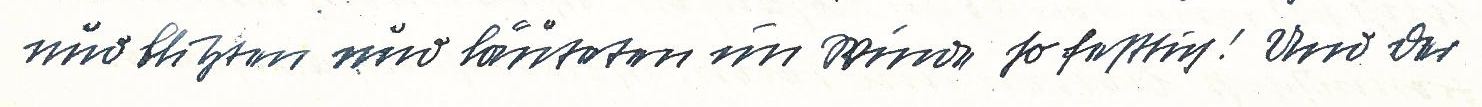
und blitzten und läuteten im Wind so festlich! Und der
